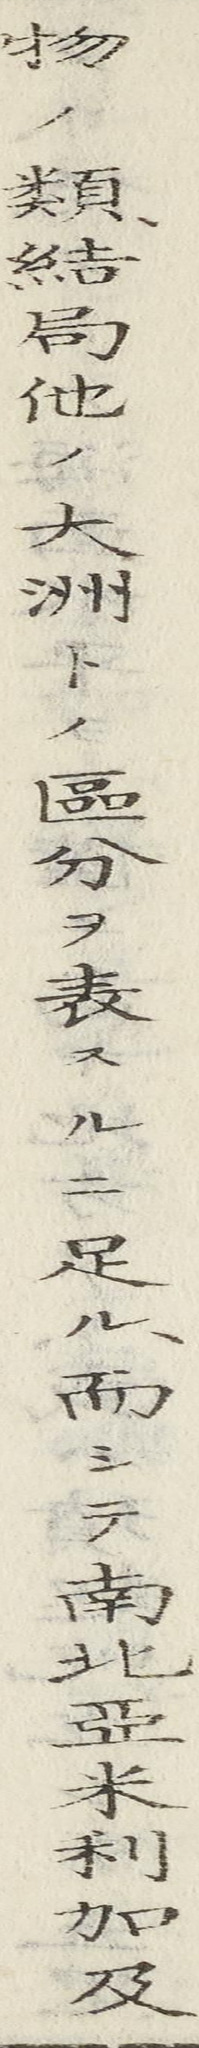物ノ類、結局他ノ大洲トノ区分ヲ表スルニ足ル、而シテ南北亜米利加及
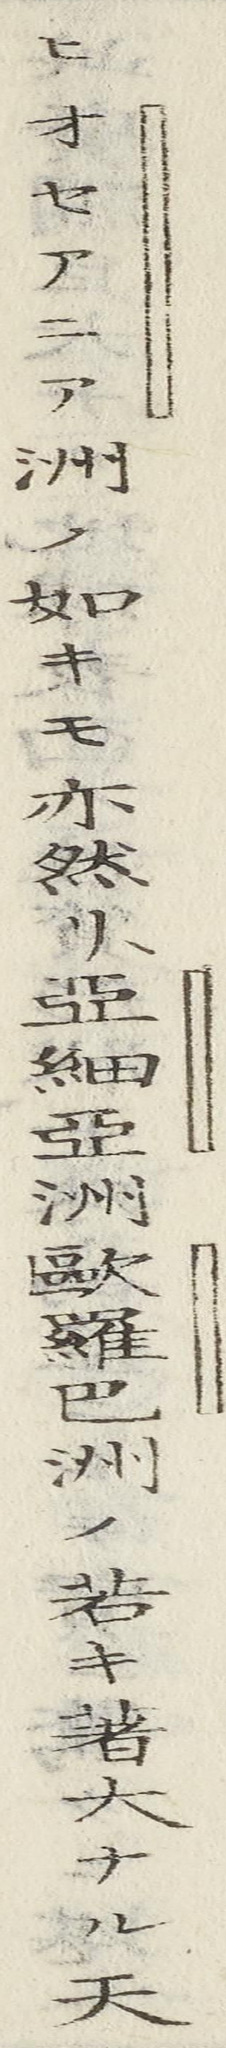ヒオセアニア洲ノ如キモ亦然リ、亜細亜洲欧羅巴洲ノ若キ著大ナル天
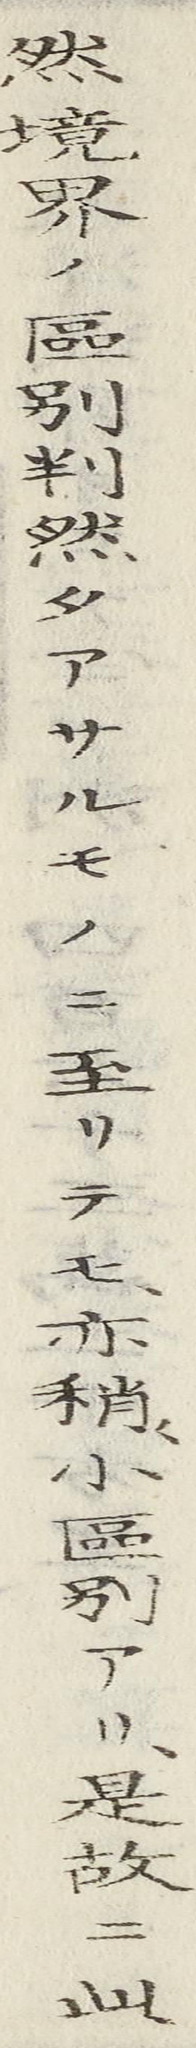然境界ノ区別判然タアサルモノニ至リテモ、亦稍〱小区別アリ、是故ニ此
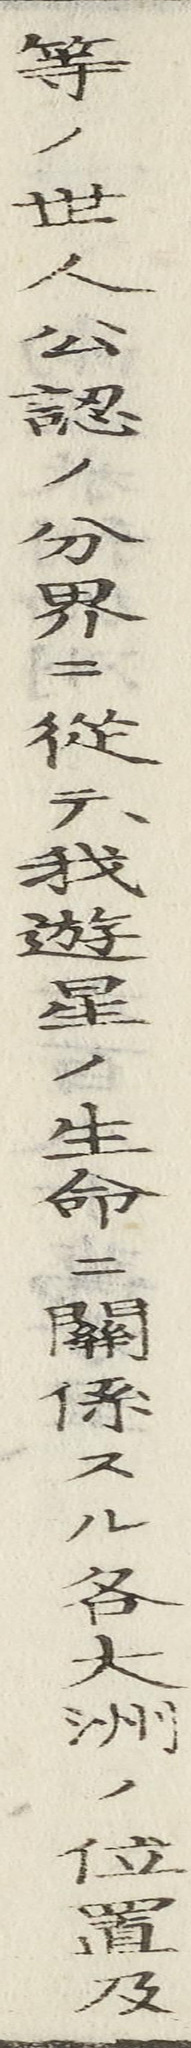等ノ世人公認ノ分界ニ従テ、我遊星ノ生命ニ関係スル各大洲ノ位置、及
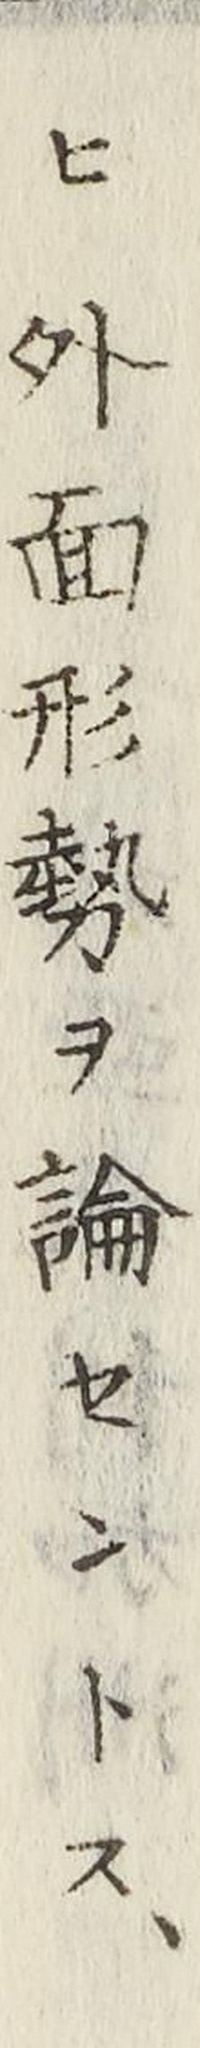ヒ外面形勢ヲ論セントス、
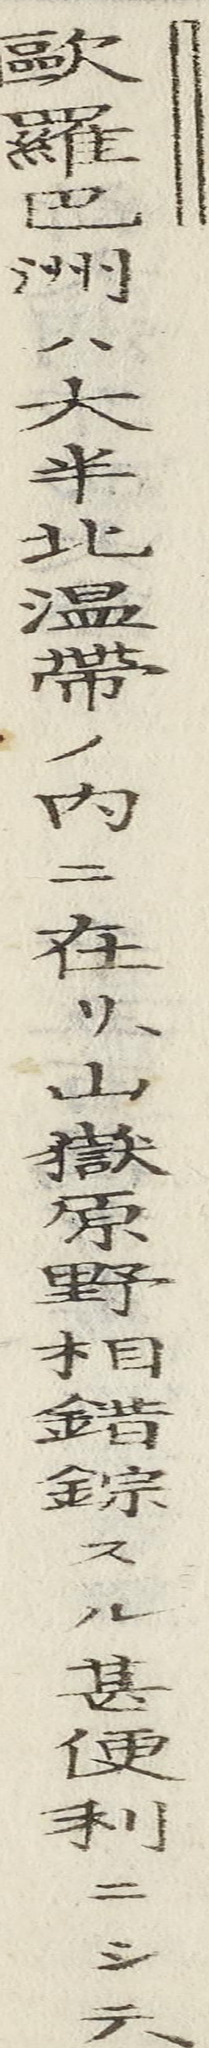欧羅巴洲ハ大半北温帯ノ内ニ在リ、山嶽原野相錯綜スル甚便利ニシテ、
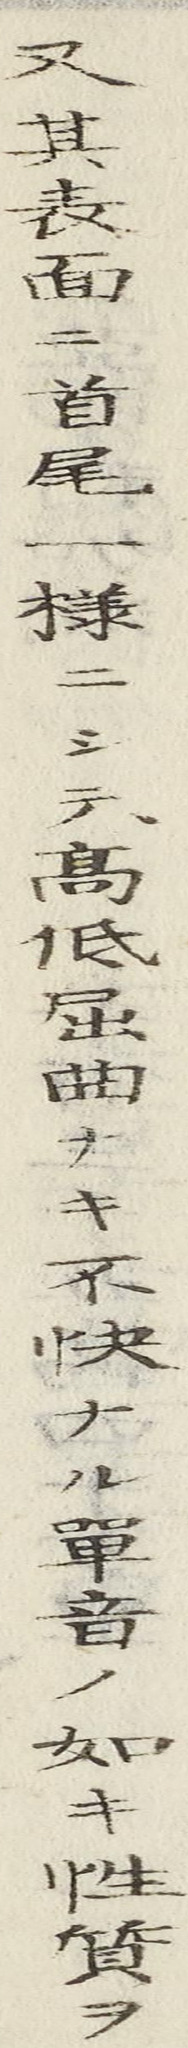又其表面ニ首尾一様ニシテ、高低屈曲ナキ不快ナル単音ノ如キ性質ヲ
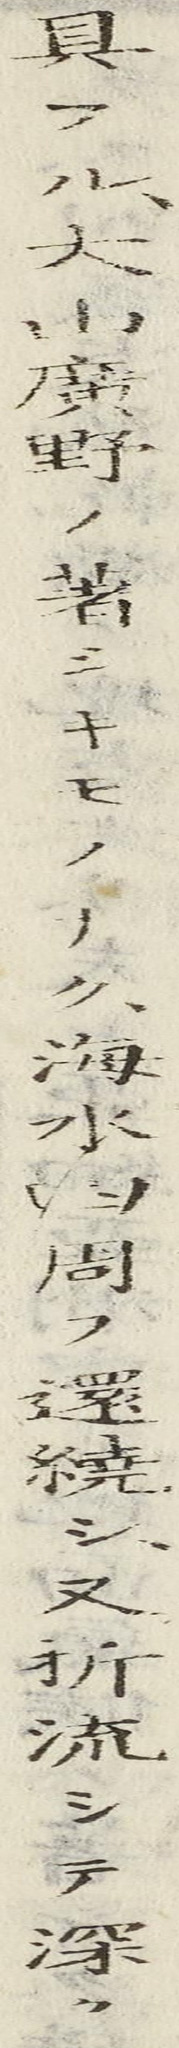具フル、大山広野ノ著シキモノナク、海水四周ヲ還繞シ、又折流シテ深ク
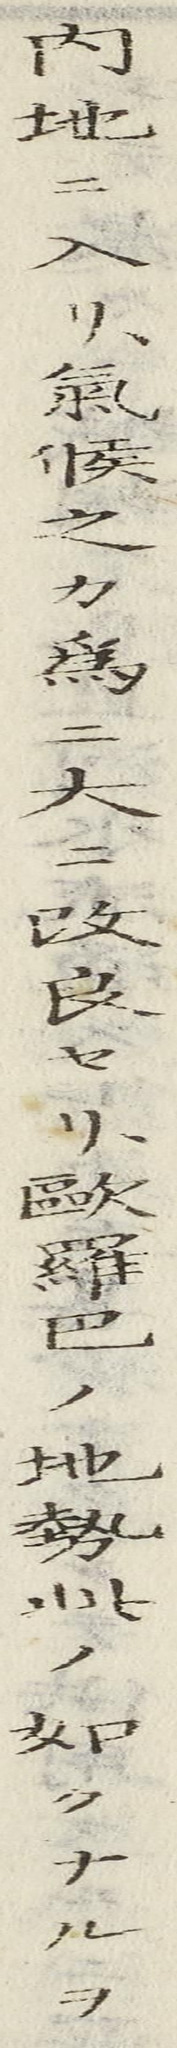内地ニ入リ、気候之カ為ニ大ニ改良セリ、欧羅巴ノ地勢此ノ如クナルヲ
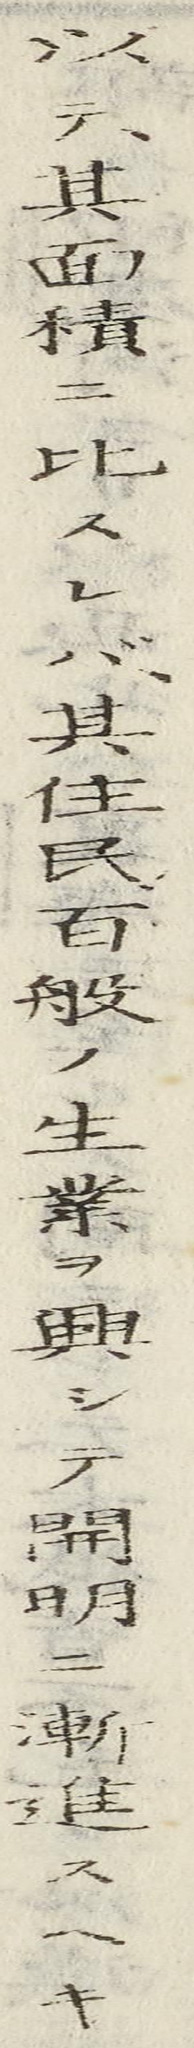以テ、其面積ニ比スレバ、其住民百般ノ生業ヲ興シテ開明ニ漸進スヘキ
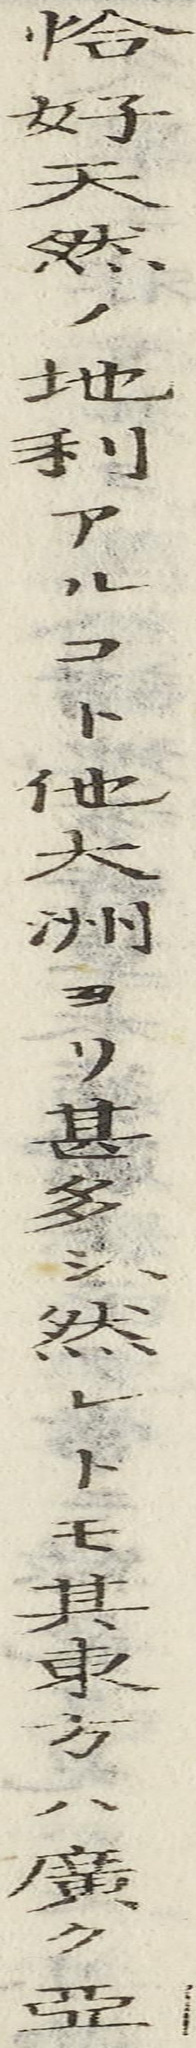恰好天然ノ地利アルコト他大洲ヨリ甚多シ、然レトモ其東方ハ広ク亜
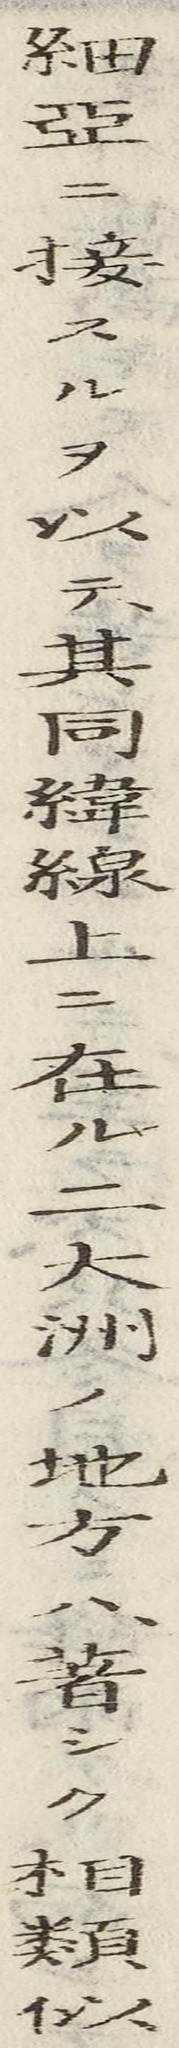細亜ニ接スルヲ以テ、其同緯線上ニ在ルニ大洲ノ地方ハ、著シク相類似
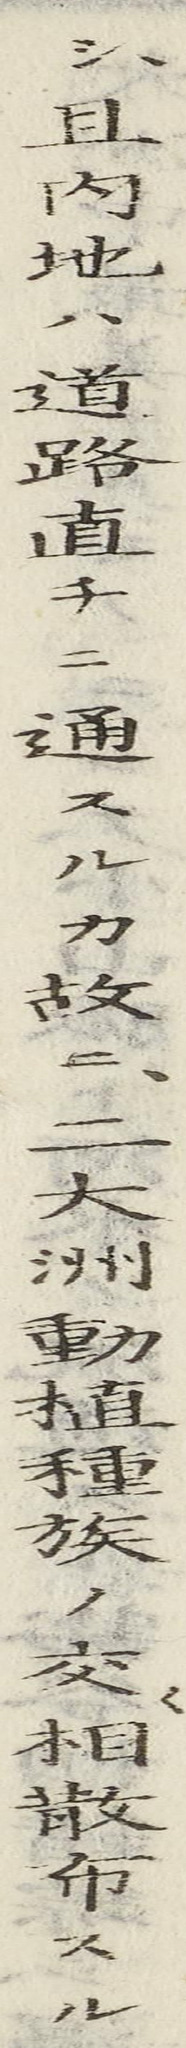シ、且内地ハ道路直チニ通スルカ故ニ、ニ大洲動植物種族ノ交〱相散布スル
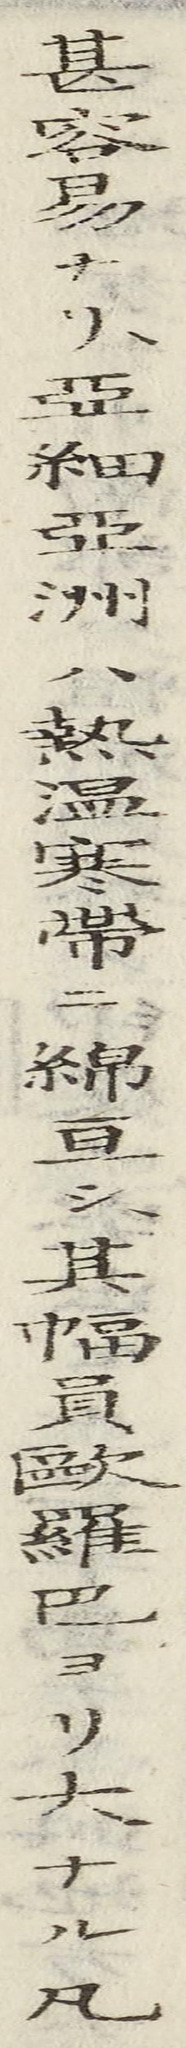甚容易ナリ、亜細亜洲ハ熱帯寒帯ニ綿亘シ、其幅員欧羅巴ヨリ大ナル凡
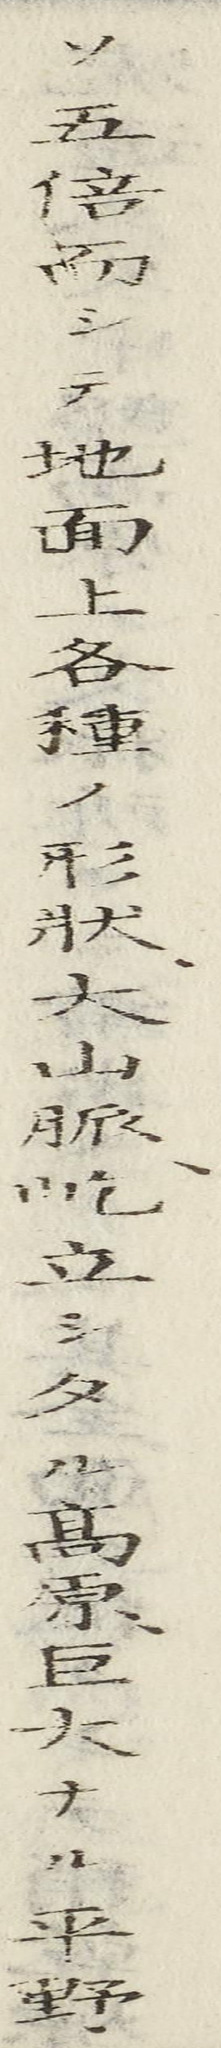ソ五倍而シテ地面上各種ノ形状、大山脈、屹立シタル高原、巨大ナル平野
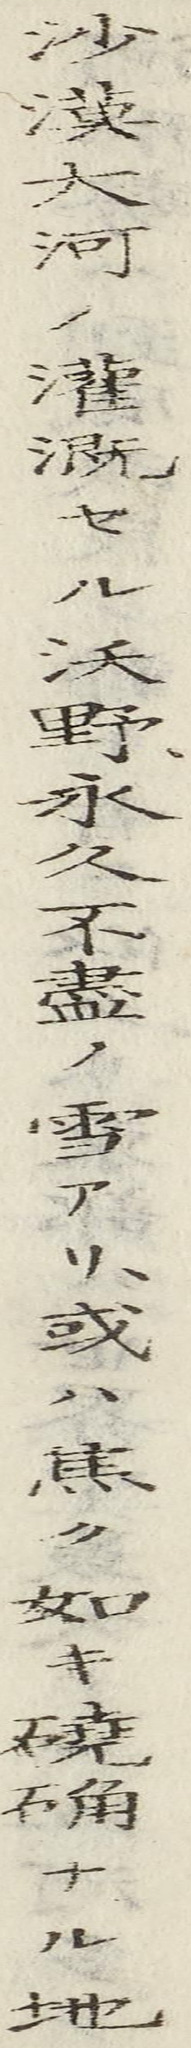沙漠大河ノ灌漑セル沃野、永久不尽ノ雪アリ、或ハ焦ク如キ磽确ナル地
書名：百科全書　地文學　全
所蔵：東京大学地震研究所図書室 Earthquake Research Institute Library, The University of Tokyo, JAPAN
